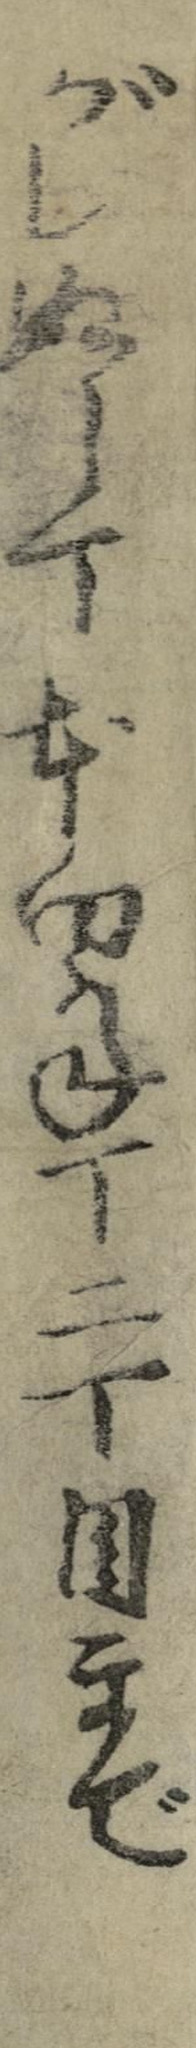がしぬし丁本白かね丁二丁目まで
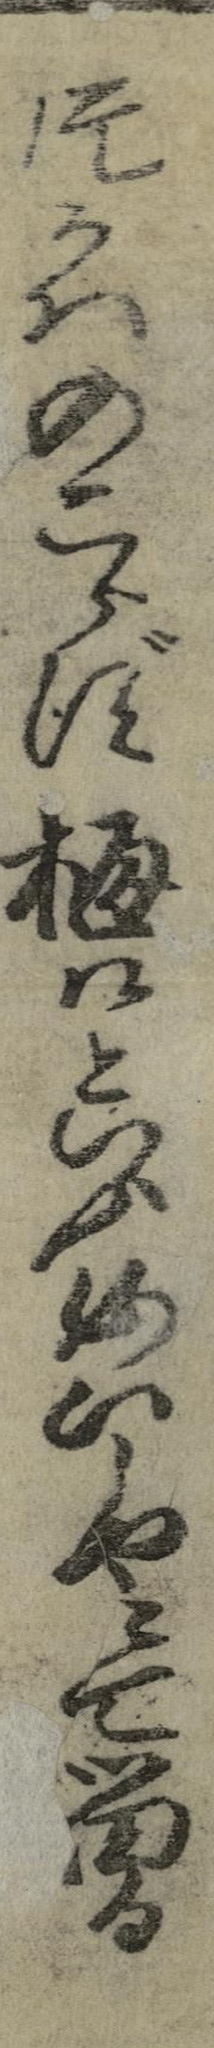片かハのこらず樋口といふめいしや二て留る
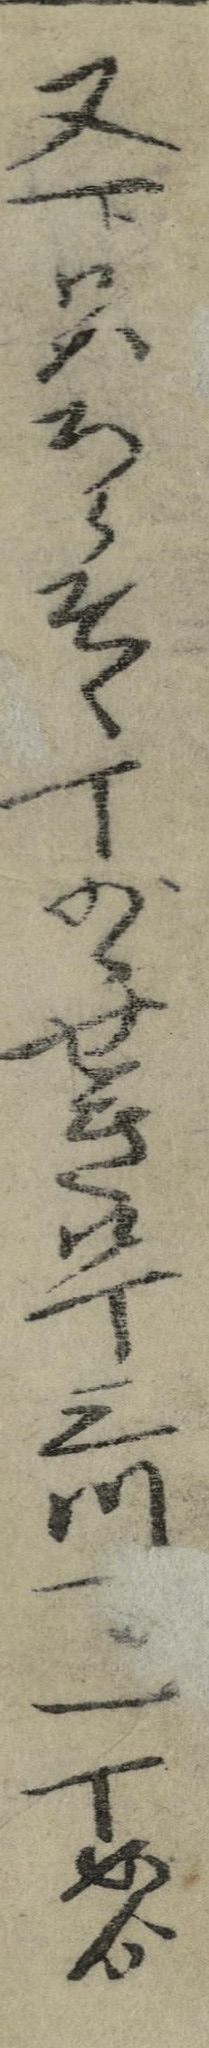又一口ハろうそく丁のゝせき口丁三川丁一丁めゟ
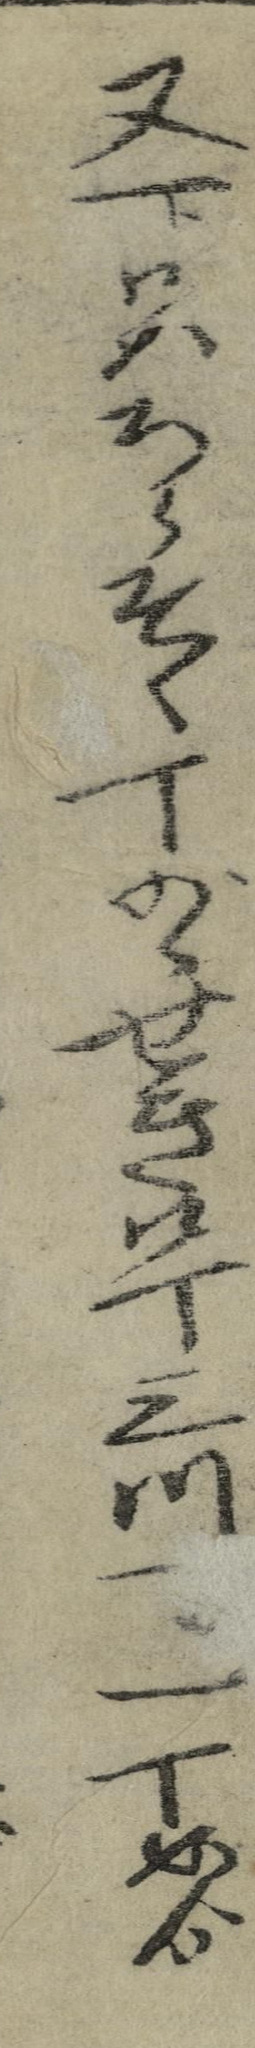又一口ハろうそく丁のゝせき口丁三川丁一丁めゟ
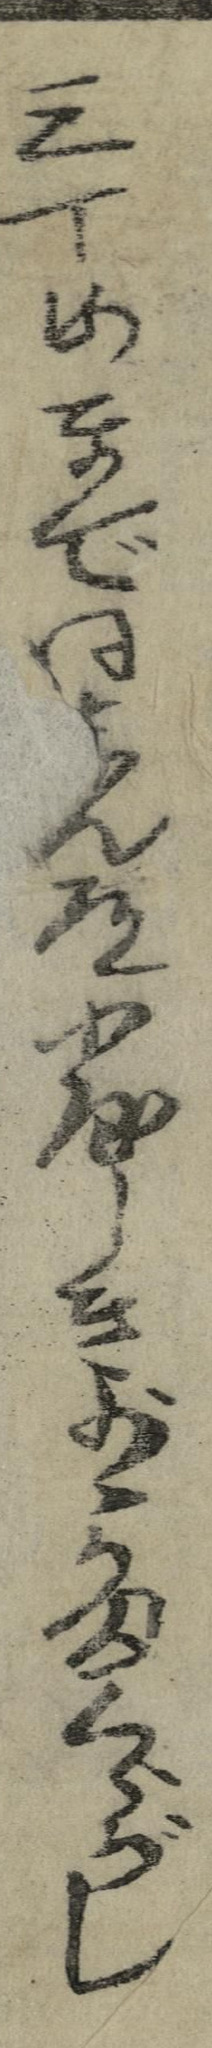三丁めまで同はん道小やしき少々かまくらがし
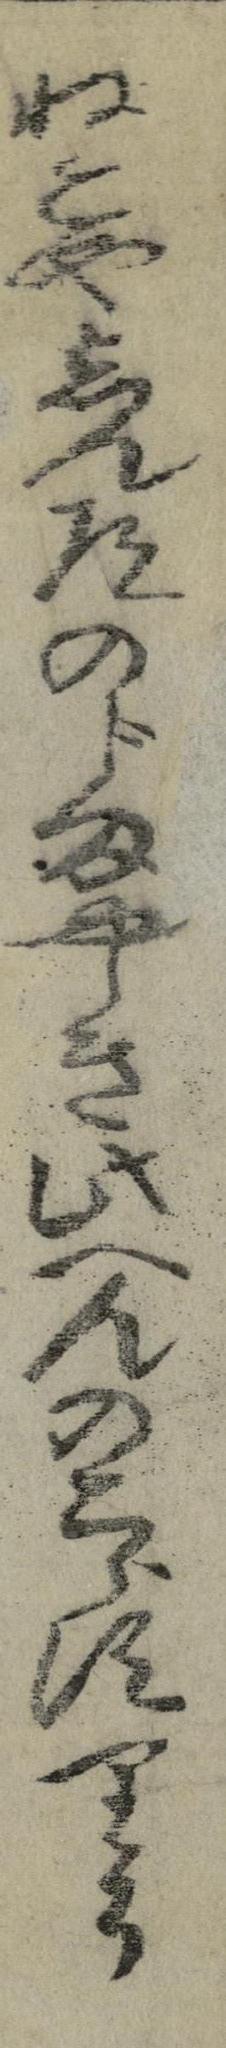ねこやしん道のじまやしき此辺のこらずりう
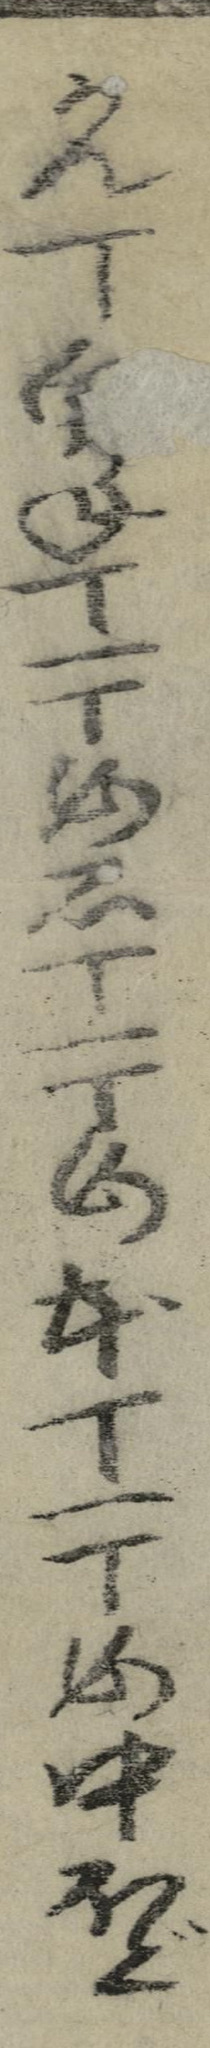かん丁白かね丁一丁め石丁一丁め本丁一丁め中ほど
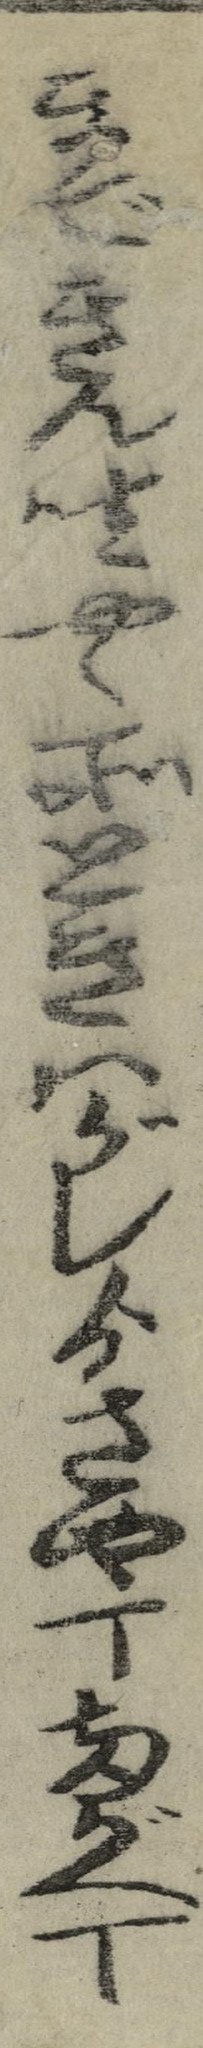まできん坐やく所ときハがしゟさや丁兩がへ丁
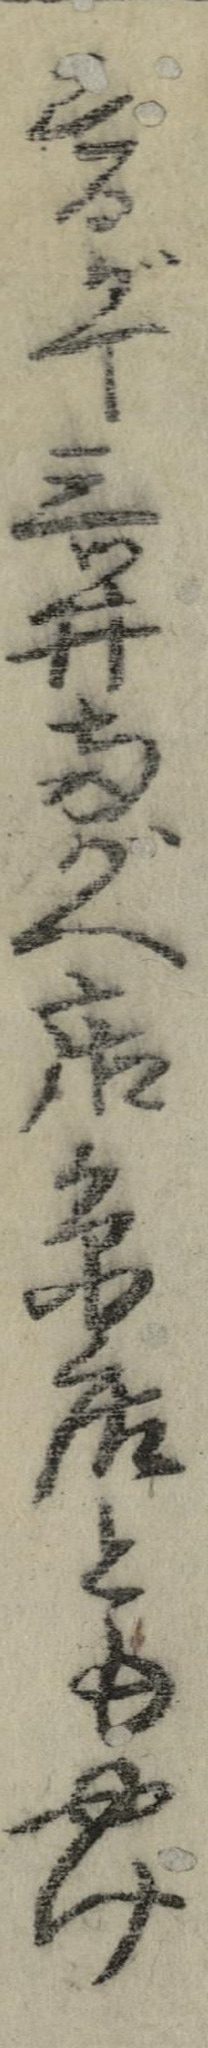するが丁三ツ井両かへ店糸店ともやけ
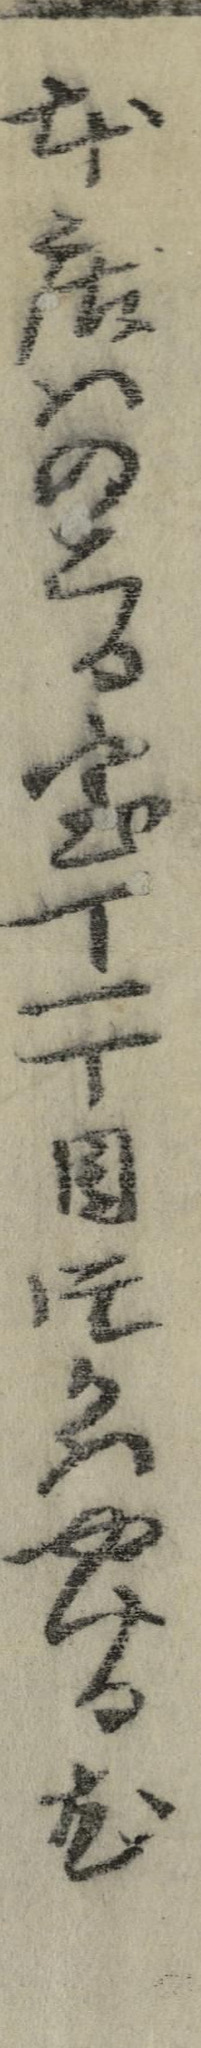本店ハのこる宝丁一丁目片かハやける尤
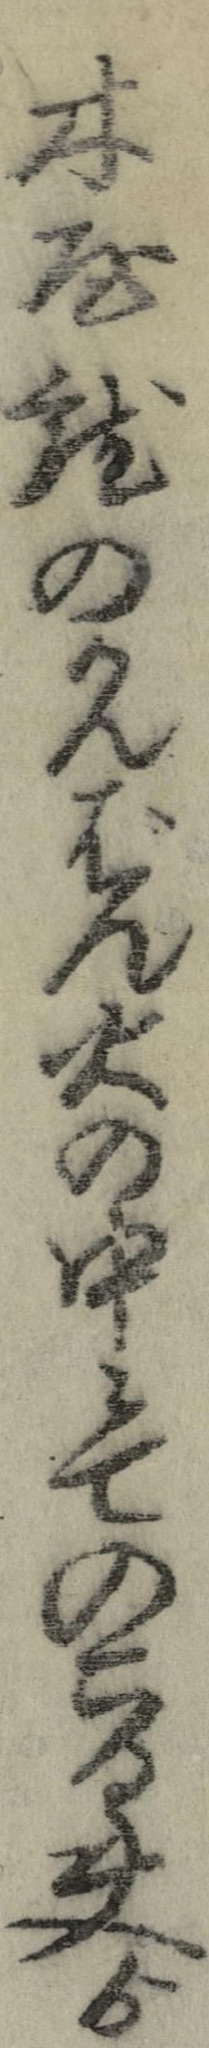木屋龍のかんばん火の中二てのこる夫ゟ
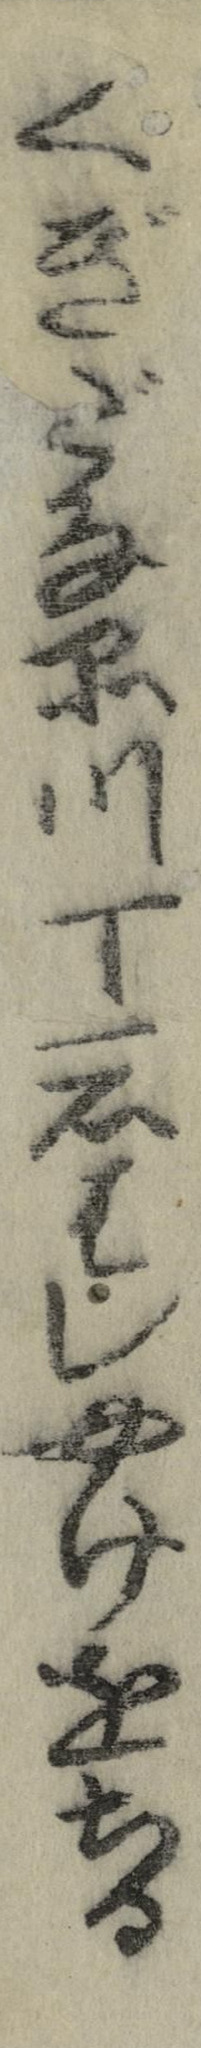くぎごな品川丁一石ばしやけをちる
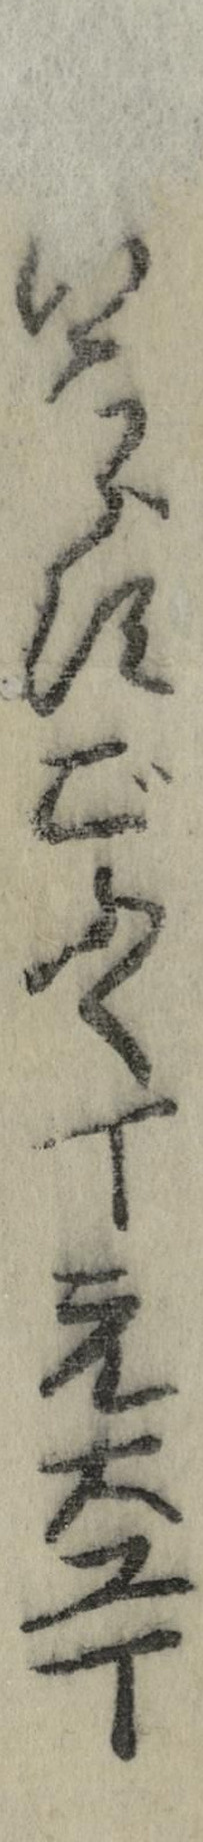向いならすごふく丁元大工丁
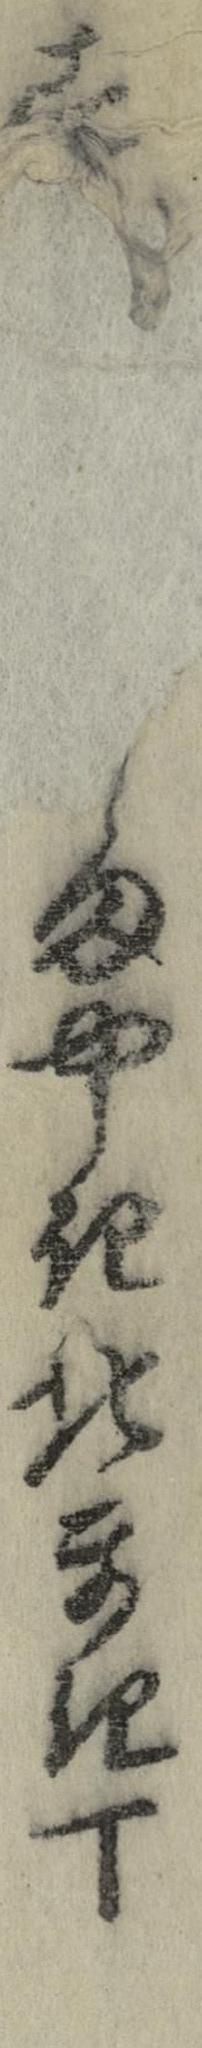まやしき北まき丁
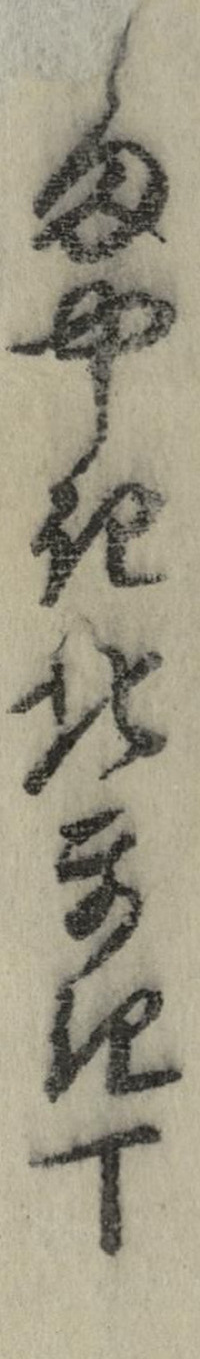まやしき北まき丁
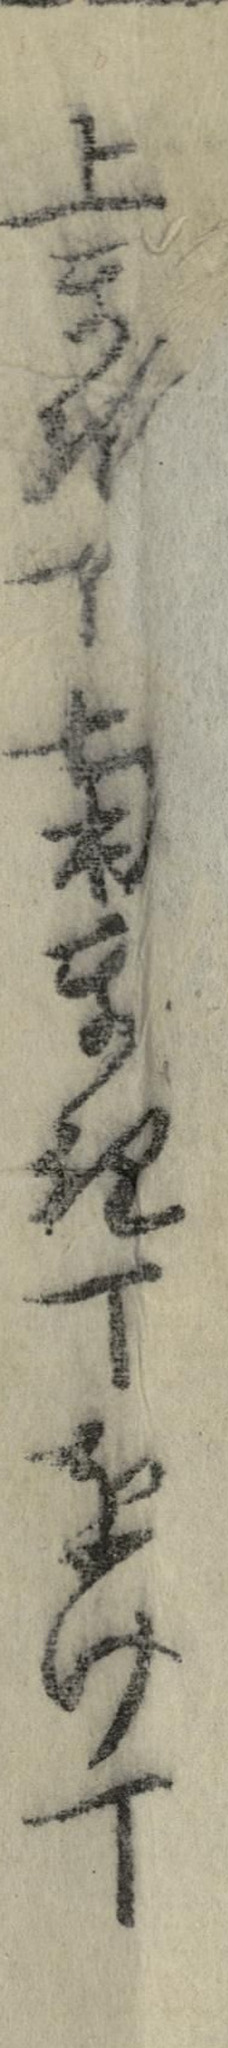上まき丁南まき丁をけ丁
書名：焼場方角場所附
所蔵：東京大学地震研究所図書室 Earthquake Research Institute Library, The University of Tokyo, JAPAN
